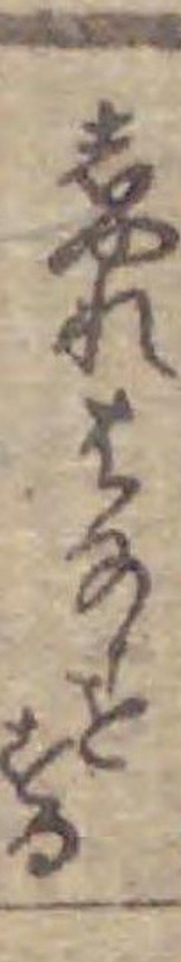しやれはなしをする
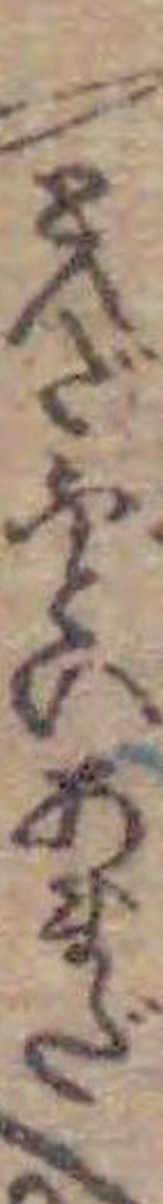とんだふといあまだ
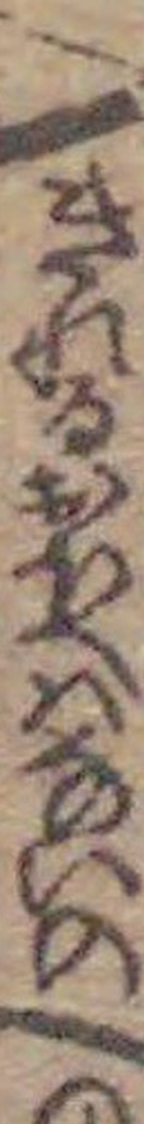きれるおほえはないの
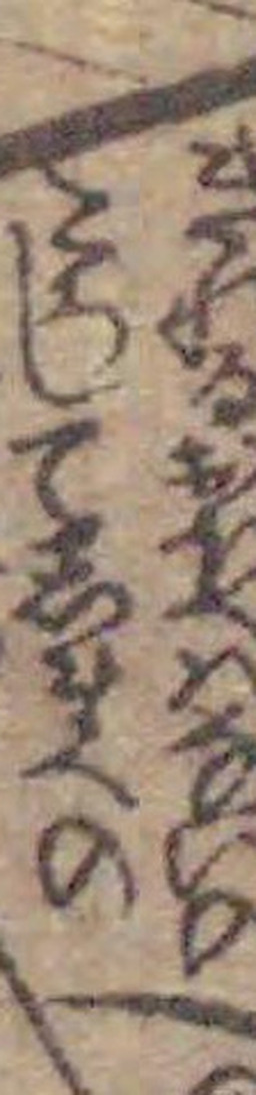ころしてしまへの
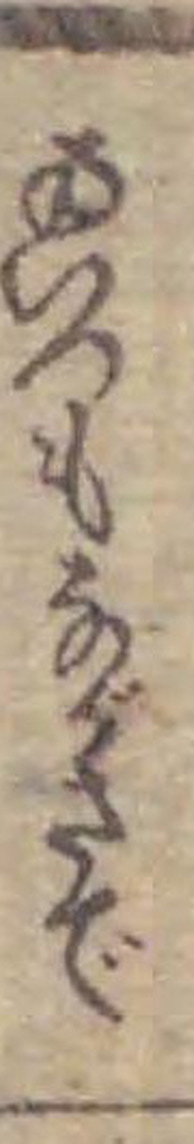あいつもながさで
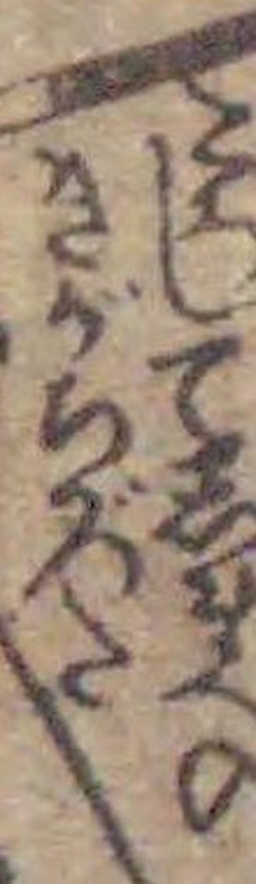きがちがつた
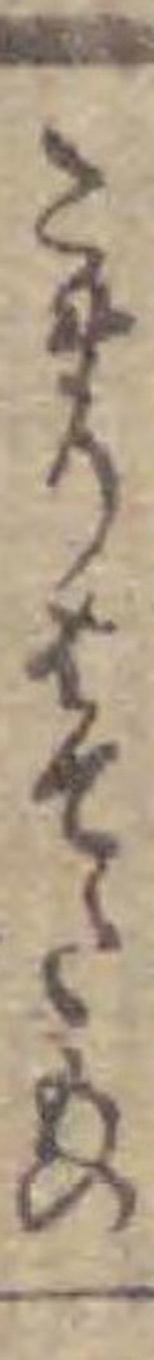こまりはてたもの
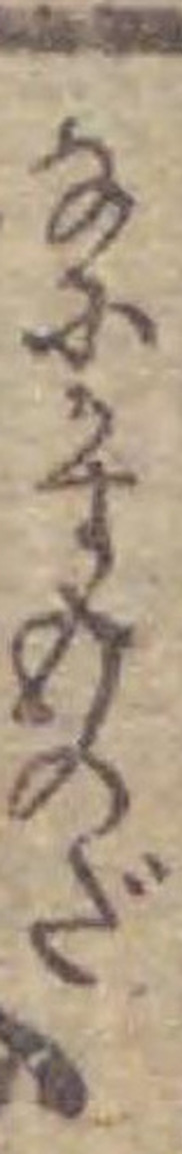なにかすものだ
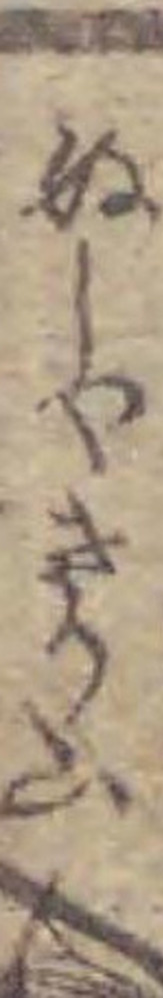ぬしやきり山
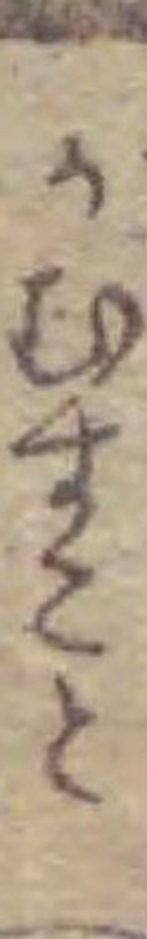かむすこと
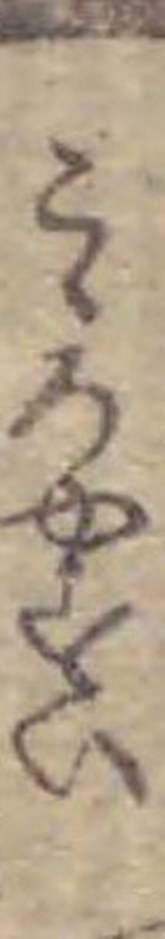こゝろやすい
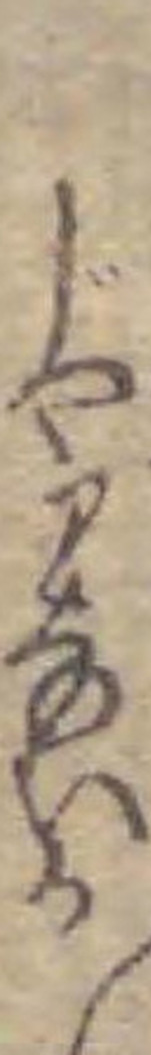じやァないか
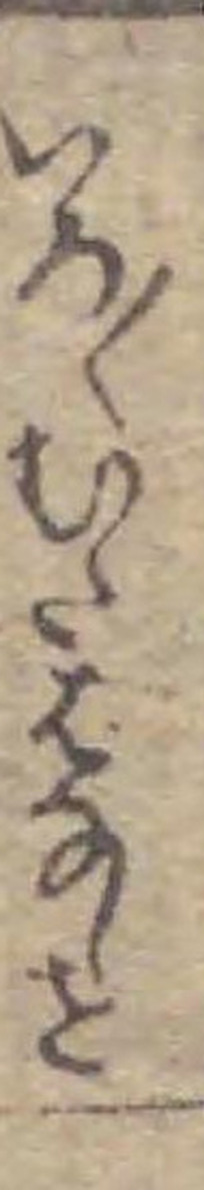いろ〳〵むたはなしを
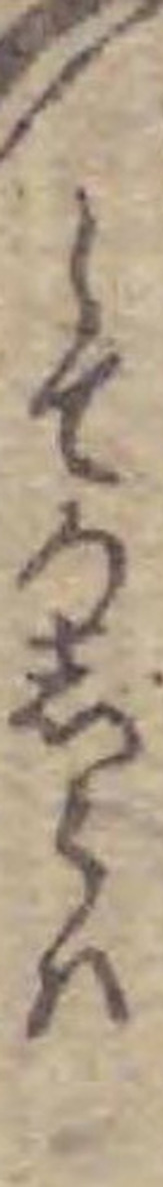してろじうは
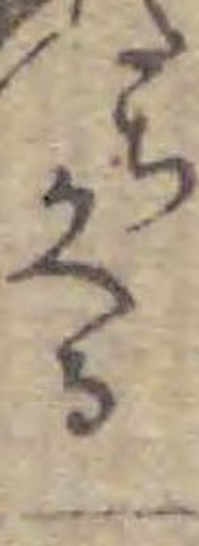かへる
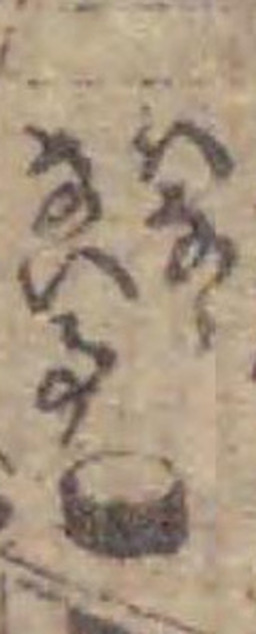ない事
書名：芸者呼子鳥 : 2巻（松泉堂）
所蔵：国立国会図書館 National Diet Library, JAPAN
